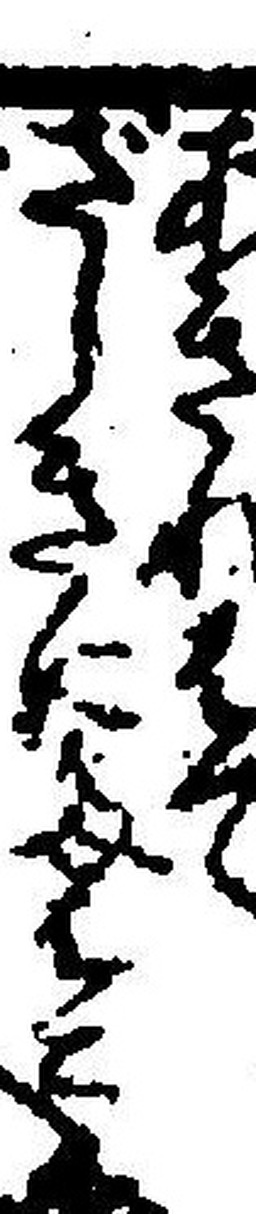ざしきにたはこ
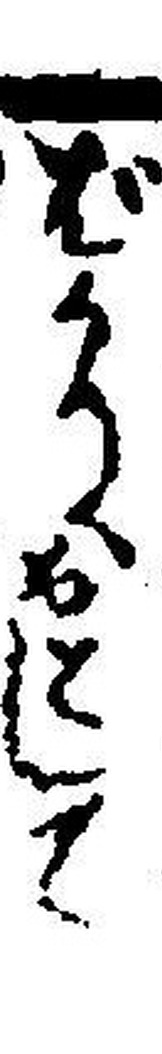ばかりおとして
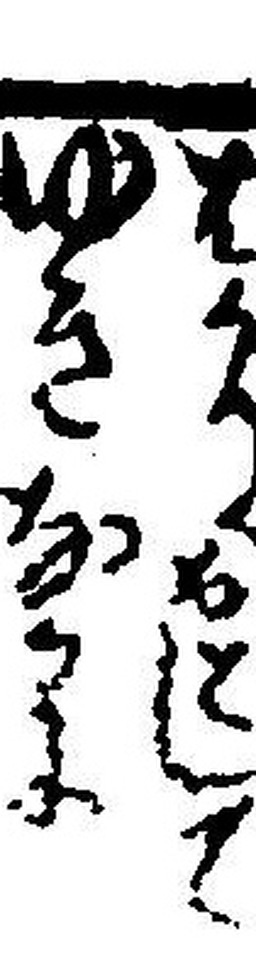ゆきなかに
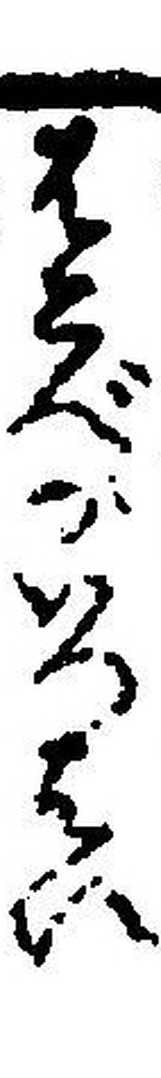はこべがいつはい
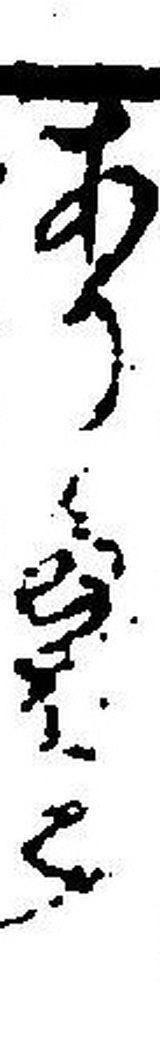ありたはこ
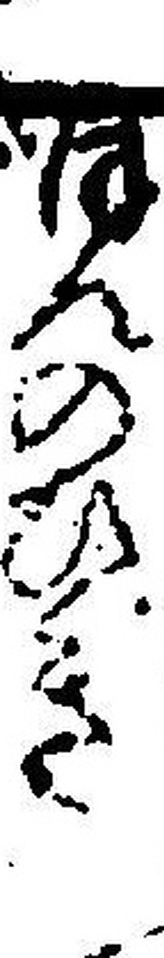ほんのひき
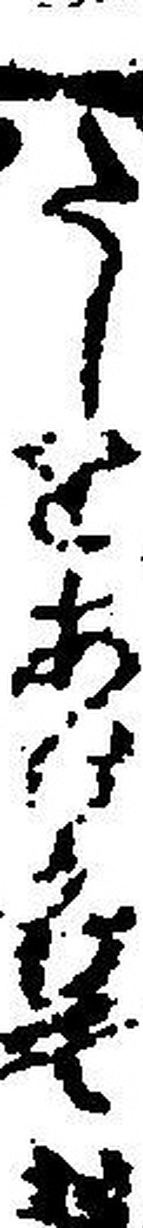だしをあけかけて
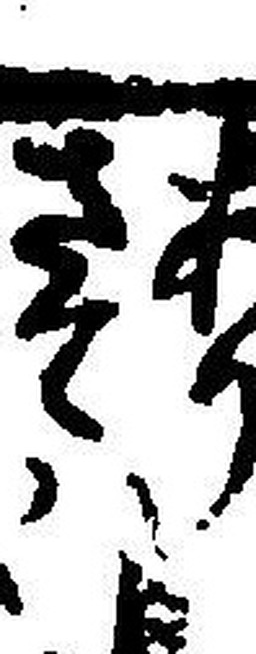さては
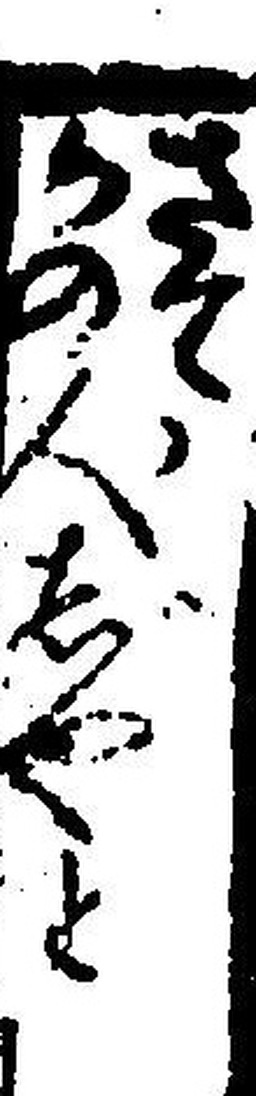かの人じやと
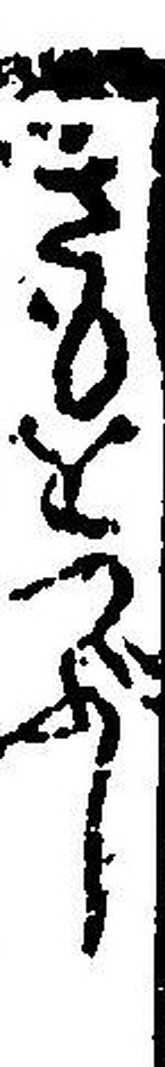きもをつぶし
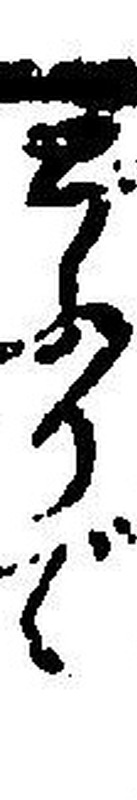どふりで
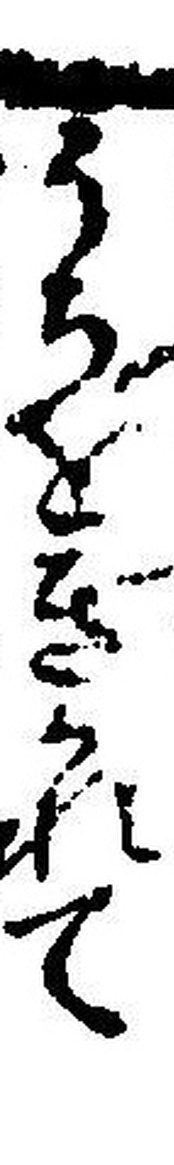うちをきかれて
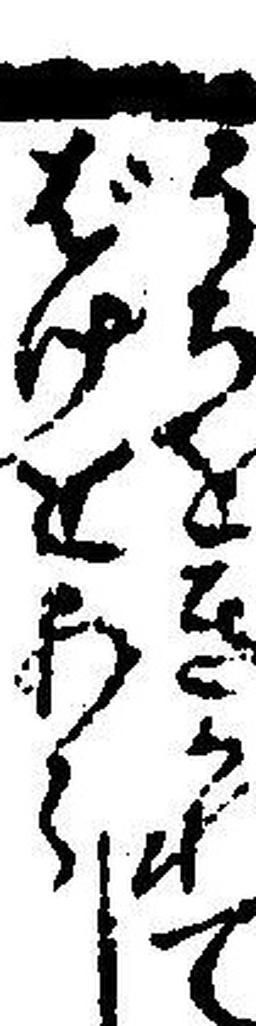ばけをあら
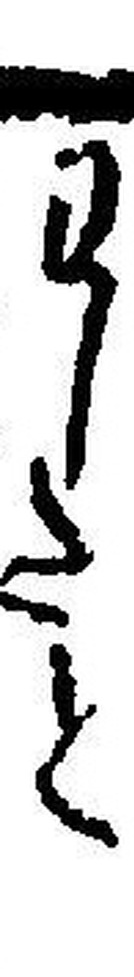わしたと
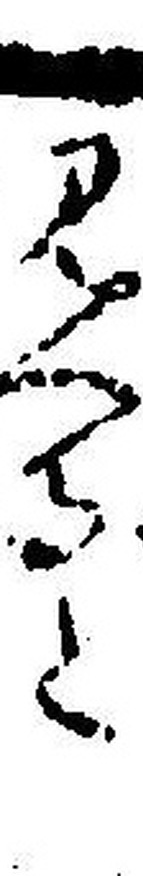見へると
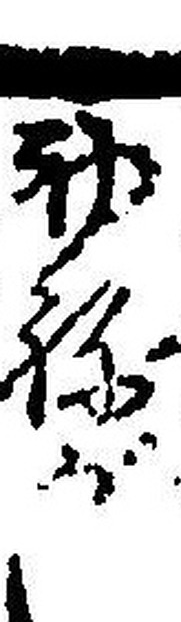初ねが
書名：間違狐之女郎買 / 市場通笑作
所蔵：東京大学総合図書館 General Library in the University of Tokyo, JAPAN
